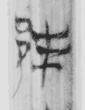邦
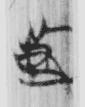{及止}
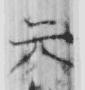亓
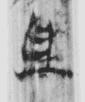{爫土}
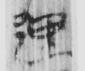{邑里}
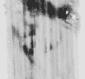四
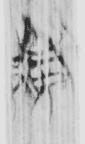{邑臱}
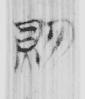則
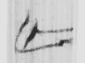亡
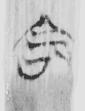命
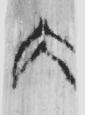大
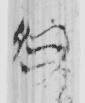於
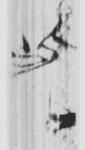此
